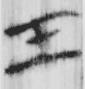壬
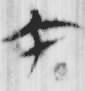午
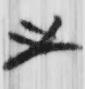之
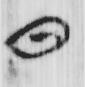日
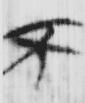不
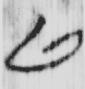㠯
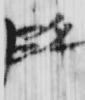阩
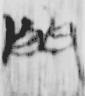門
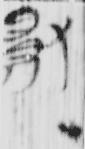敗
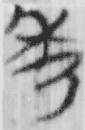秀
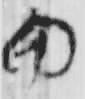免
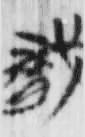戠
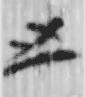之
